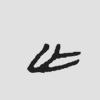亡
